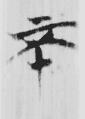不
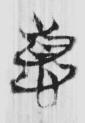惠
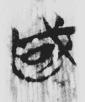或
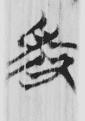爰
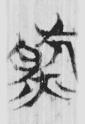然
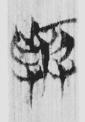與
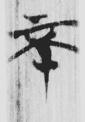不
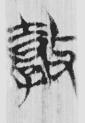{𣪊子}
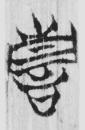請
